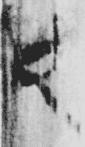也
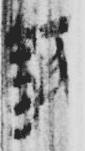䎽（聞）
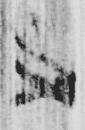之
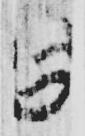曰
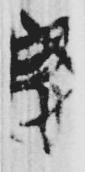○（悔）
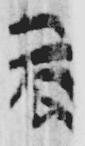而
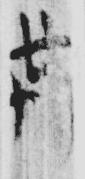共（恭）
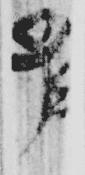孫（遜）
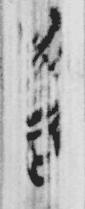○（教）
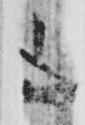之
